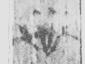卌
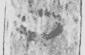四
